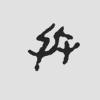兵
